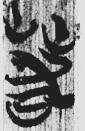春
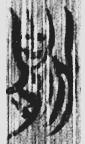猒（厭）
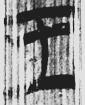王
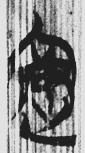○（就）
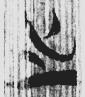之
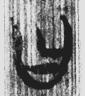曰
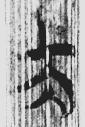夫
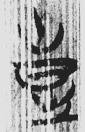彭
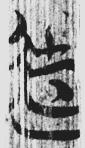徒
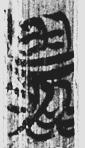○（一）
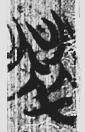○（勞）爲
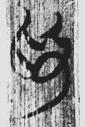爲
